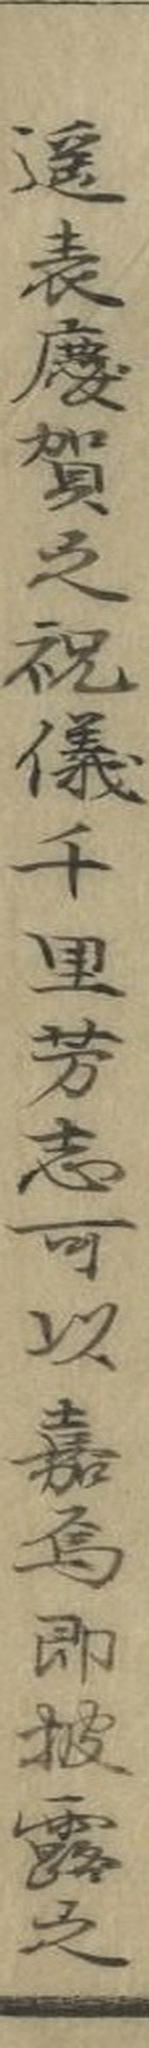遥表慶賀之祝儀千里芳志可以嘉焉即披露之
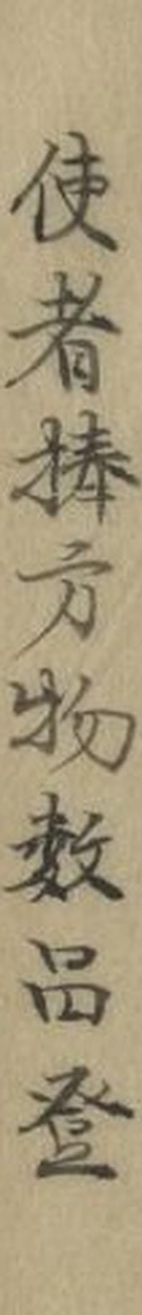使者捧方物数品登

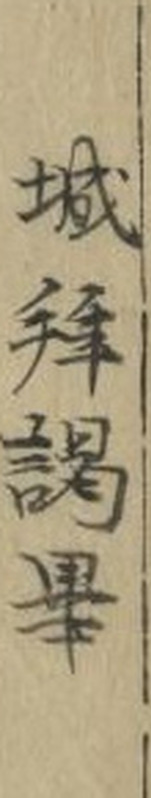城拝謁畢
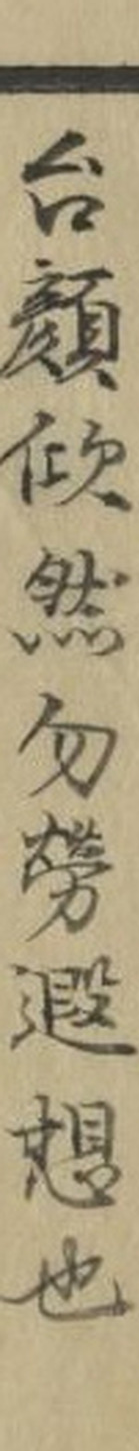台顔傾然勿労遥遐也
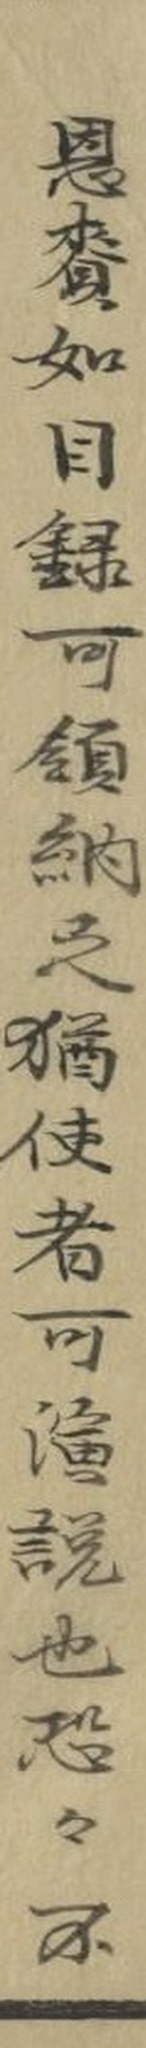恩賚如目録可領納之猶使者可演説也恐々不
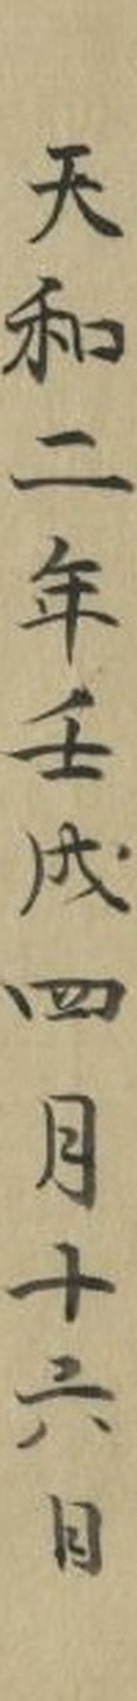天和二年壬戌四月十六日
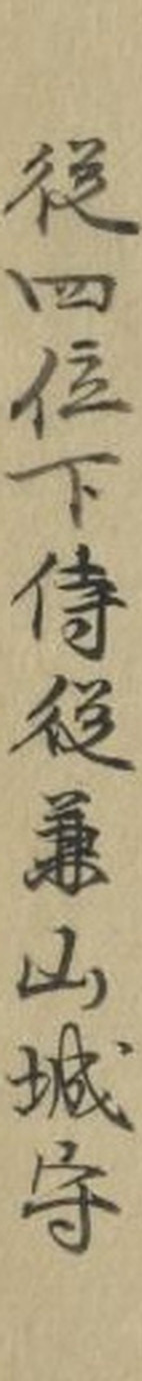従四位下侍従兼山城守
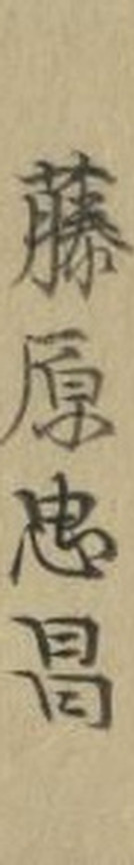藤原忠昌
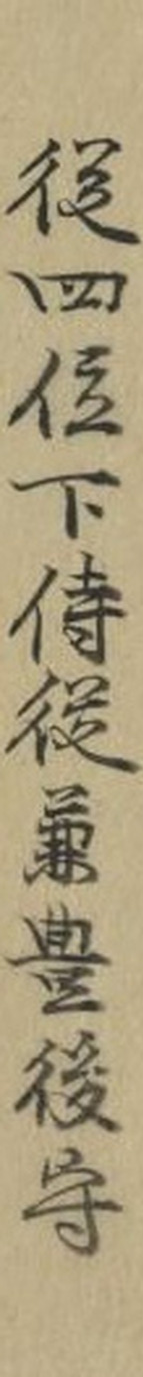従四位下侍従兼豊後守
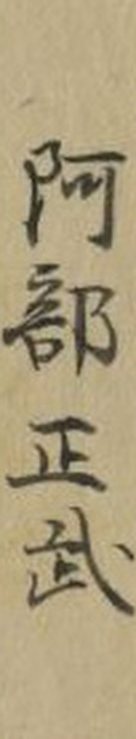阿部正武
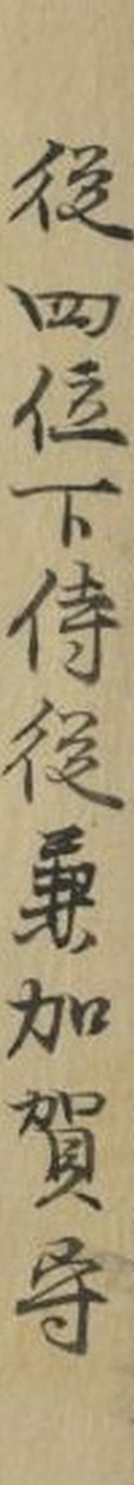従四位下侍従兼加賀守
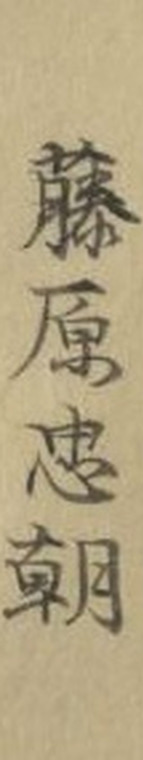藤原忠朝
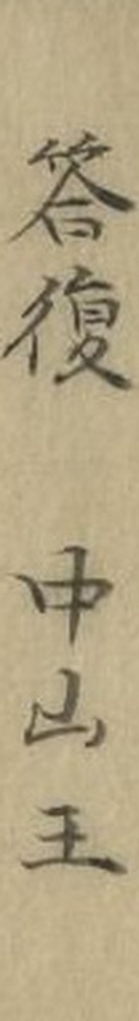答復中山王
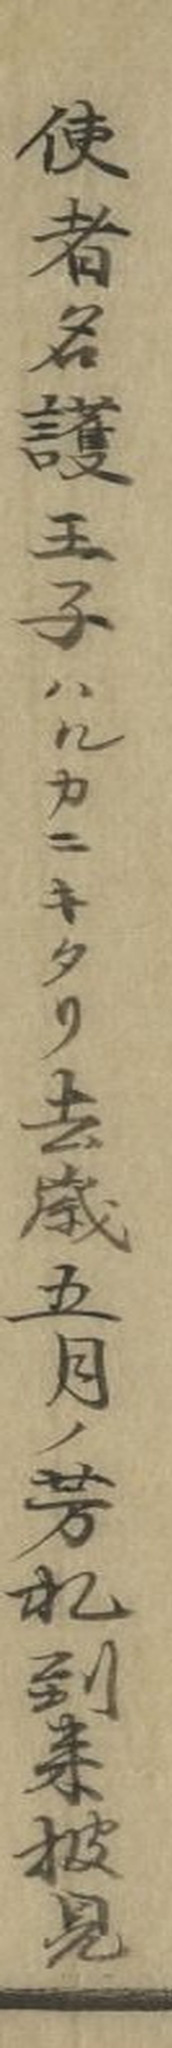使者名護王子ハルカニキタリ去歳五月ノ芳札到来披見
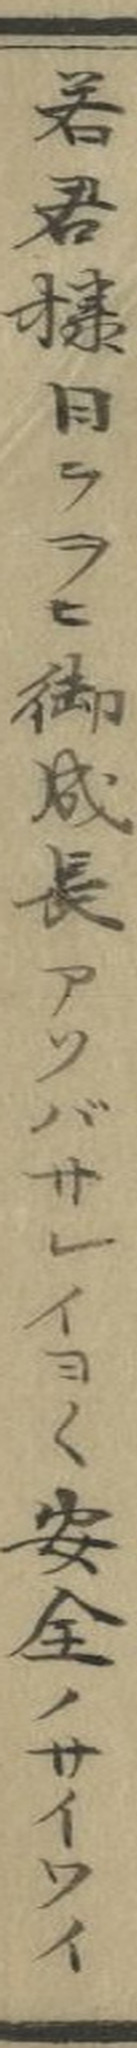若君様日ヲヲヒ御成長アソバサレイヨ〳〵安全ノサイワイ
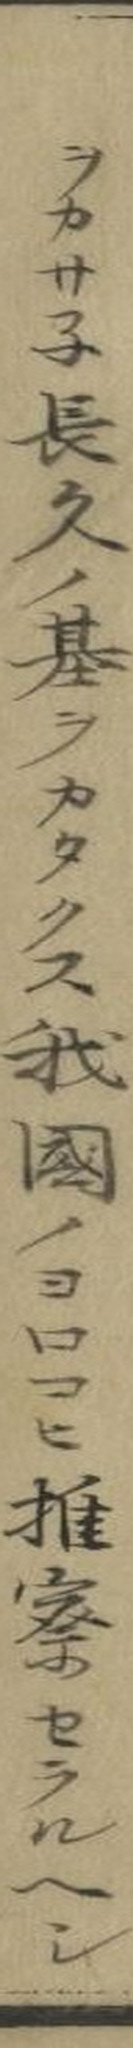ヲカサネ長久ノ基ヲカタクス我国ノヨロコヒ推察セラルヘシ
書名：琉球往来（下）
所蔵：University of the Ryukyus Library
